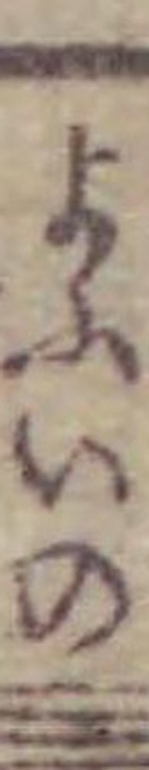よふいの
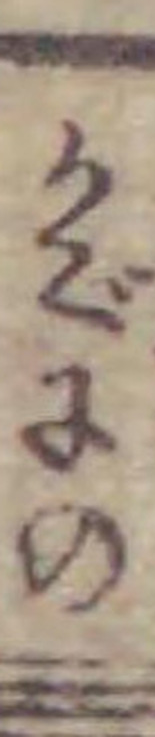かごにの
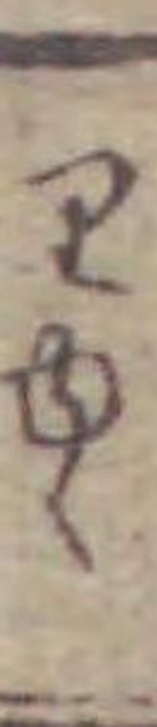りゆく
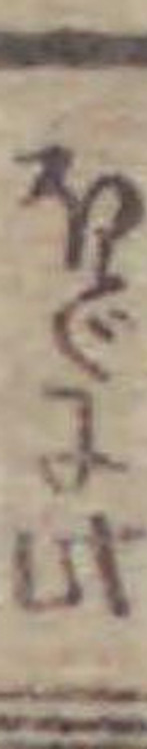ほどに此
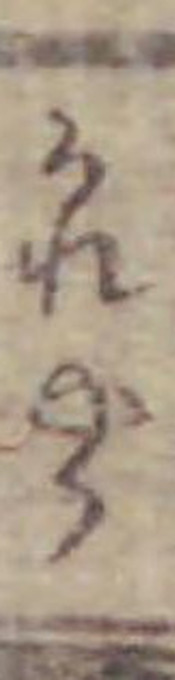かれやら
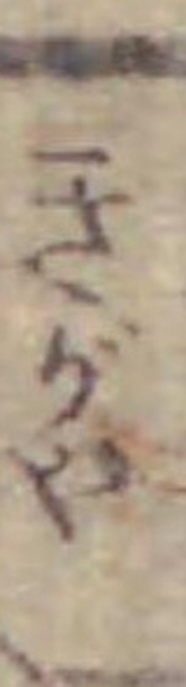きがや
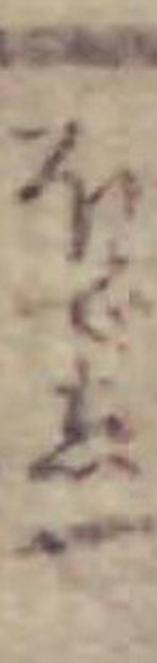ほどし
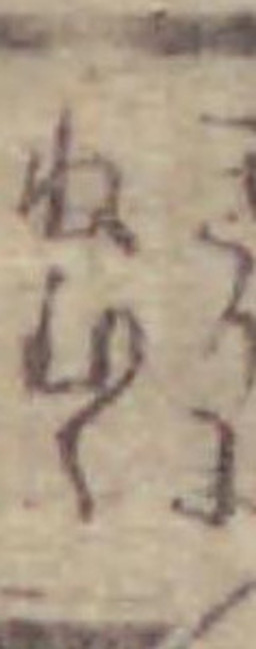ねむく
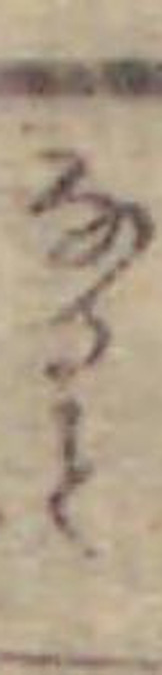なると
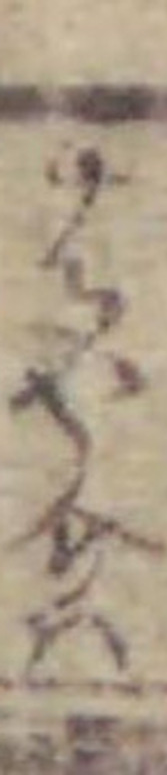はや介は
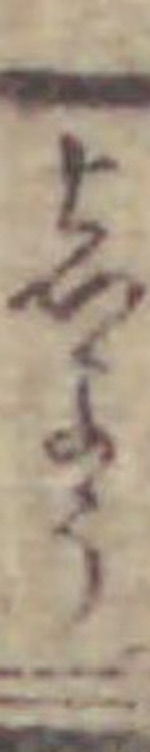しよう
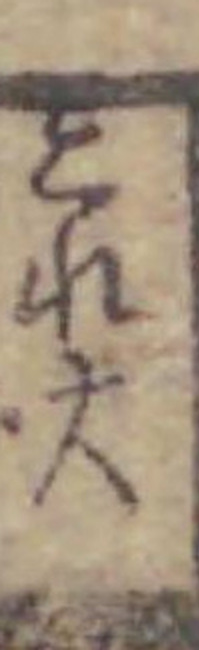これ大
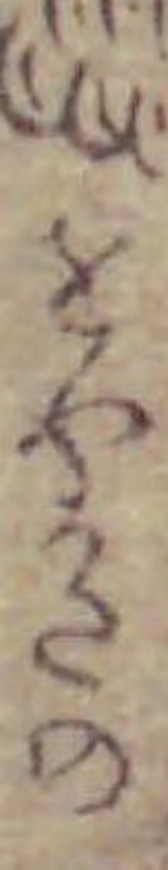をやかたの
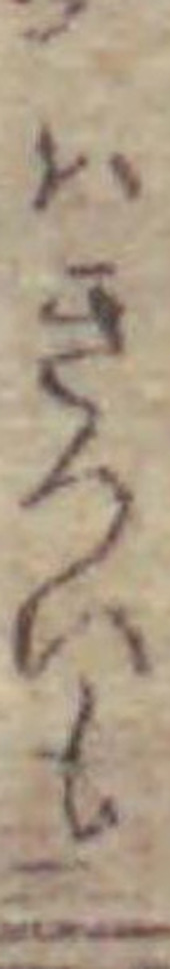はきついも
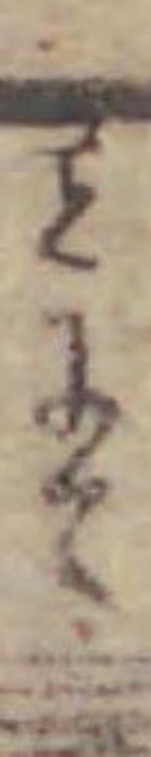ごとにて
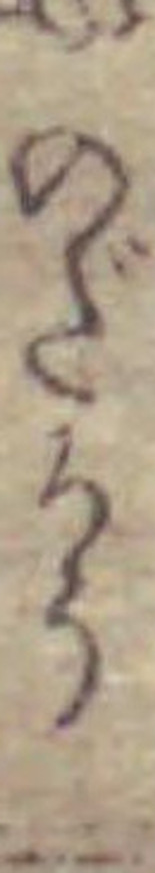のだかう
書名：二日替 : 2巻
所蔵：国立国会図書館 National Diet Library, JAPAN
